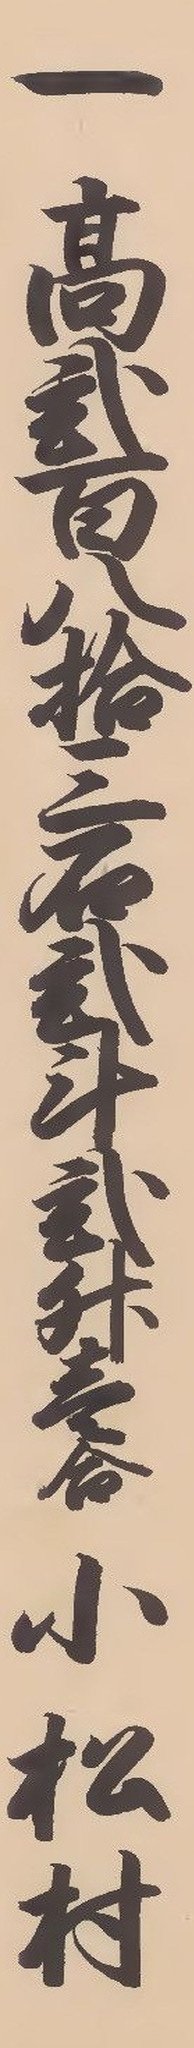一高弐百八拾三石弐斗弐升壱合小松村
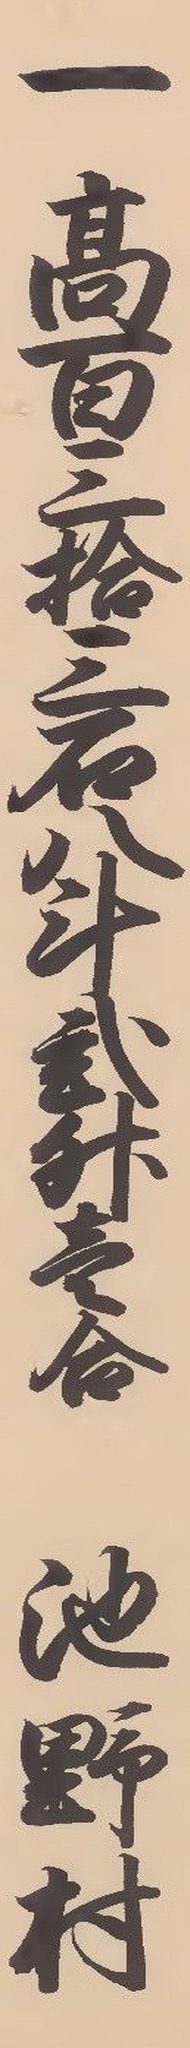一高百三拾三石八斗弐升壱合池野村
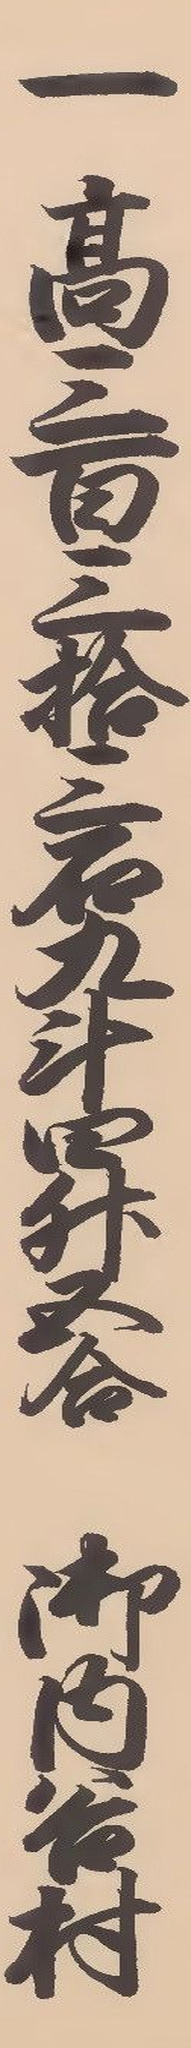一高三百三拾三石九斗四升五合御内谷村
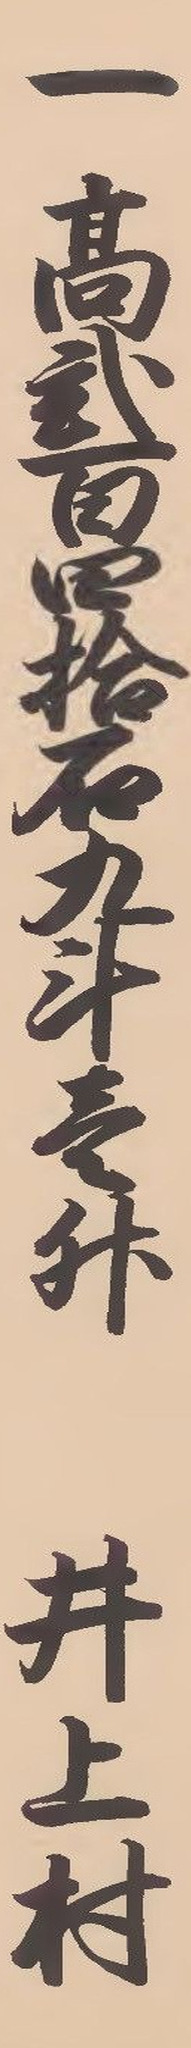一高弐百四拾石九斗壱升井上村
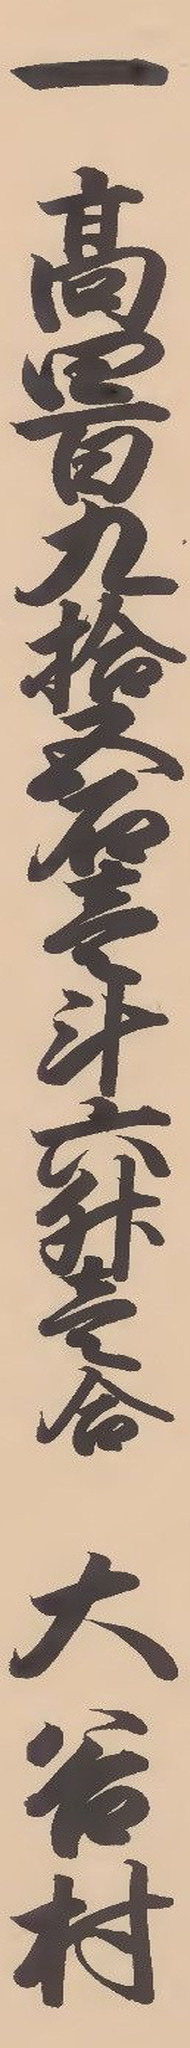一高四百九拾五石壱斗六升壱合大谷村
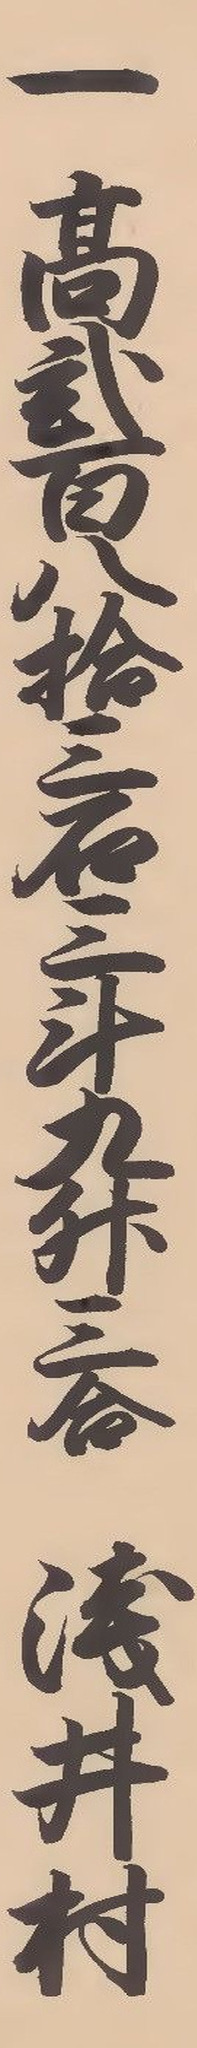一高弐百八拾三石三斗九升三合浅井村
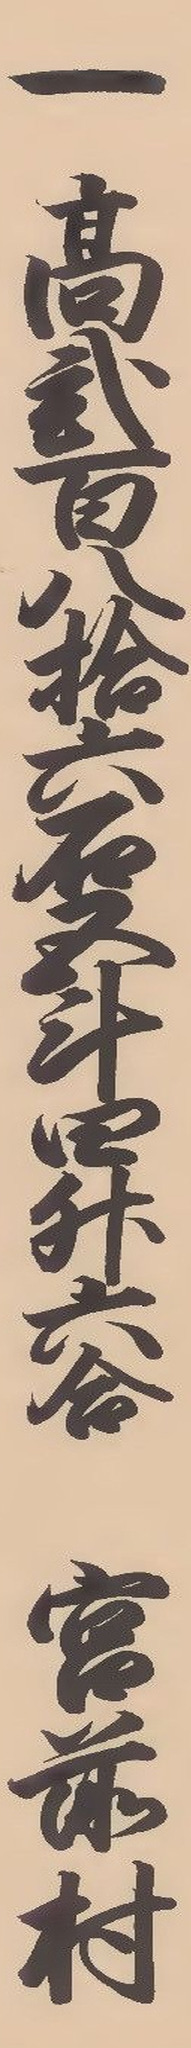一高弐百八拾六石五斗四升六合宮前村
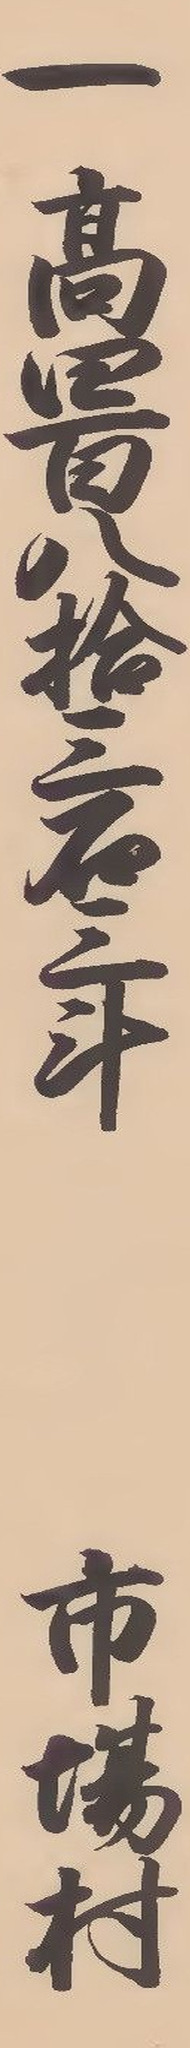一高四百八拾三石三斗市場村

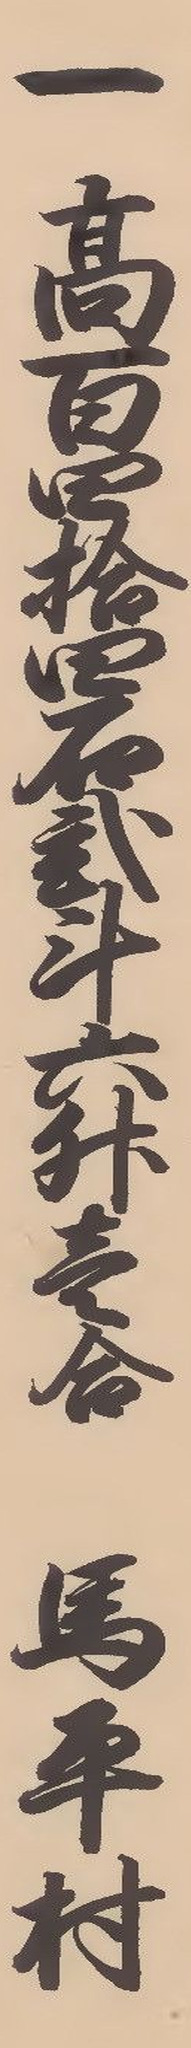一高百四拾四石弐斗六升壱合馬平村
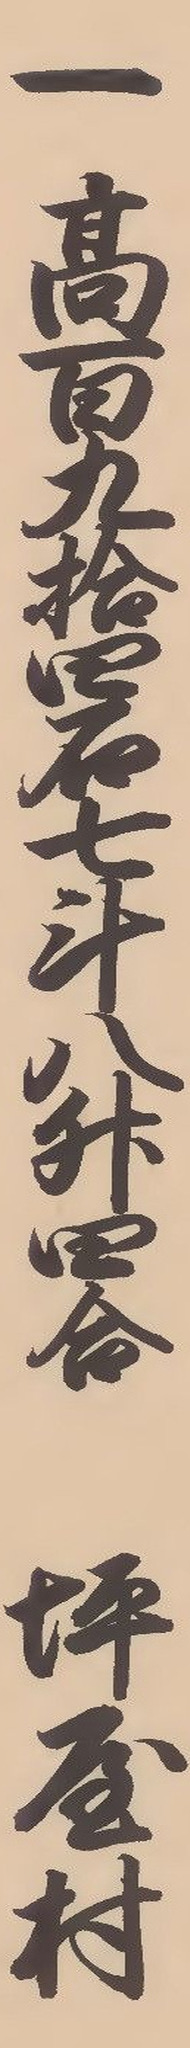一高百九拾四石七斗八升四合坪屋村
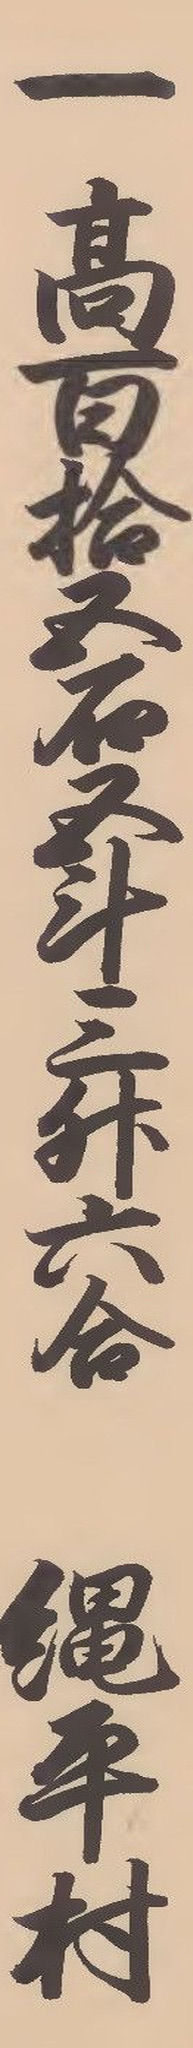一高百拾五石五斗三升六合縄平村
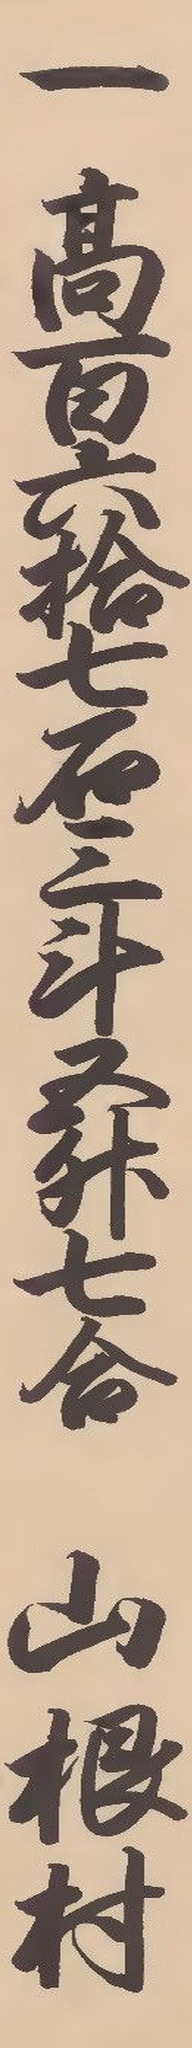一高百六拾七石三斗五升七合山根村
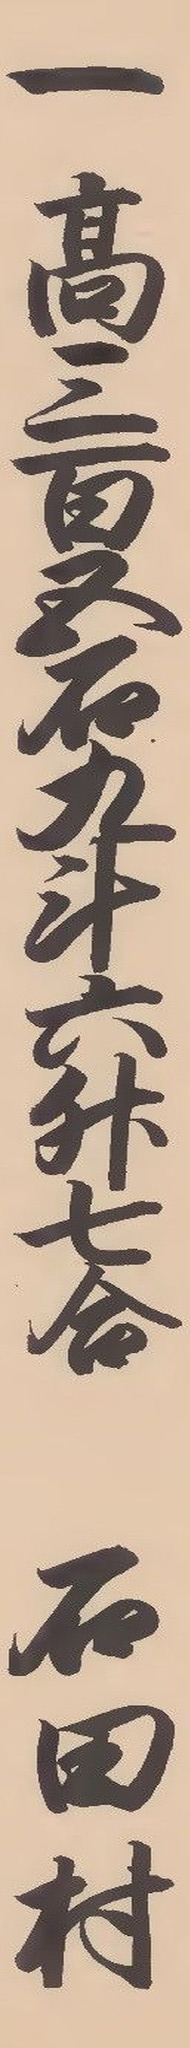一高三百五石九斗六升七合石田村
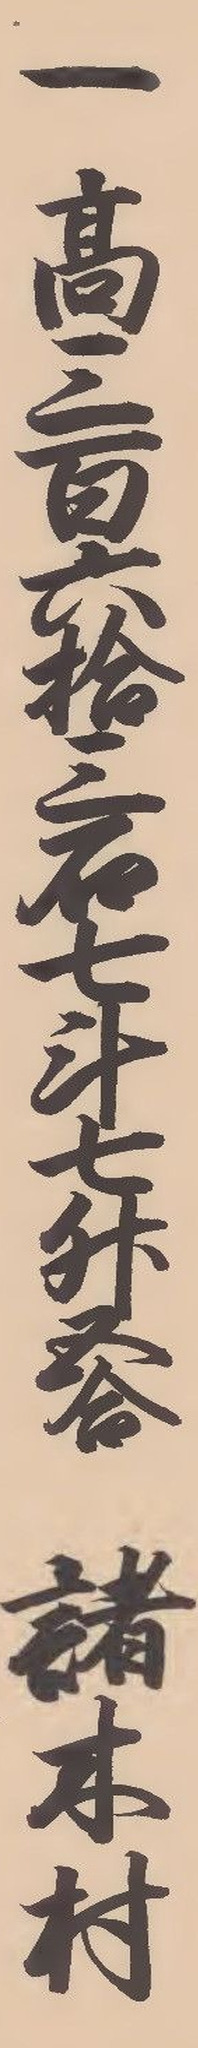一高三百六拾三石七斗七升五合諸木村
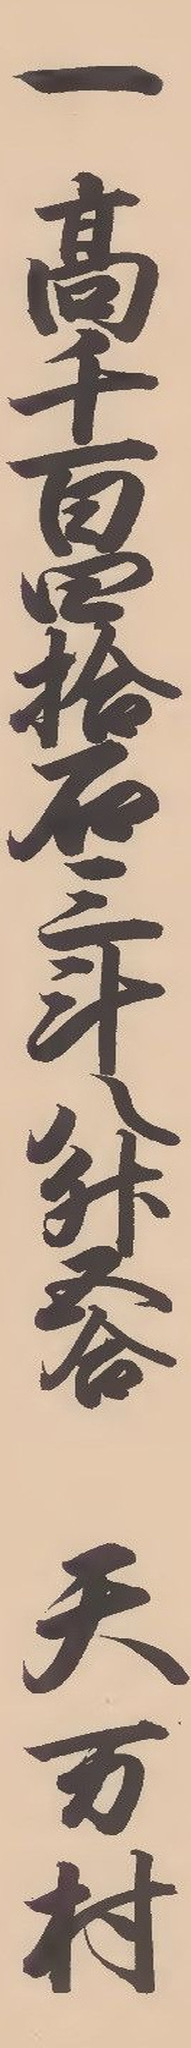一高千百四拾石三斗八升五合天万村

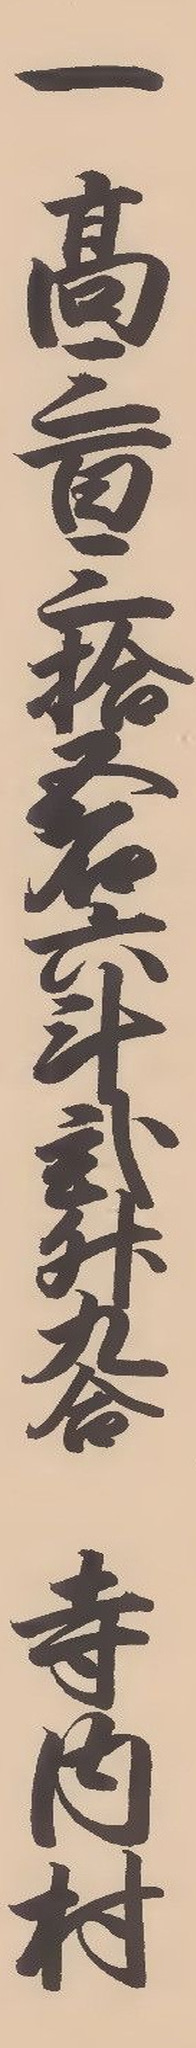一高三百三拾五名六斗弐升九合寺内村
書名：伯耆国郷帳
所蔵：国立公文書館 National Archives of Japan
